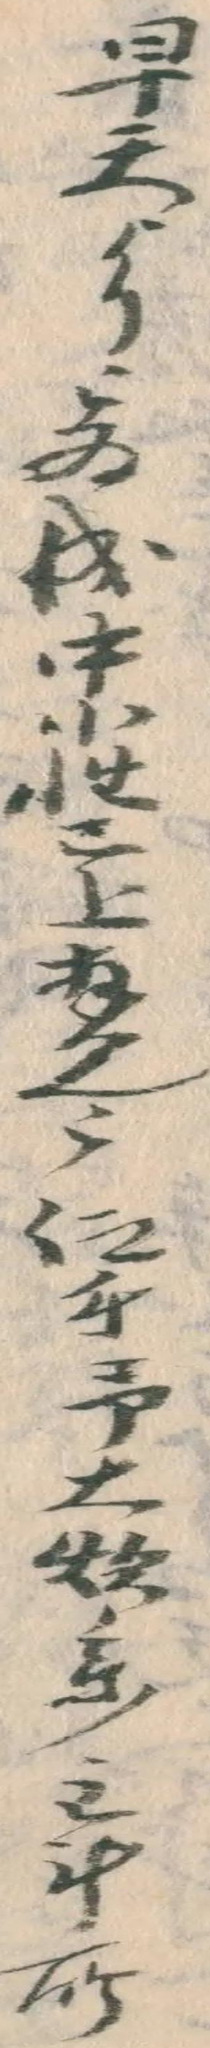早天より被為成中小性已上拝見被仰付予大炊参主斗所
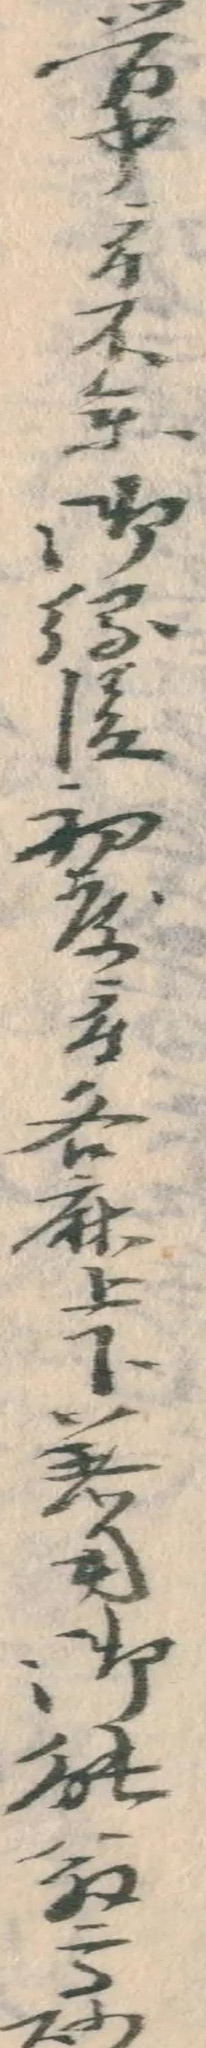労中二付不参御縁後初度ニ付各麻上下着用御能翁高砂
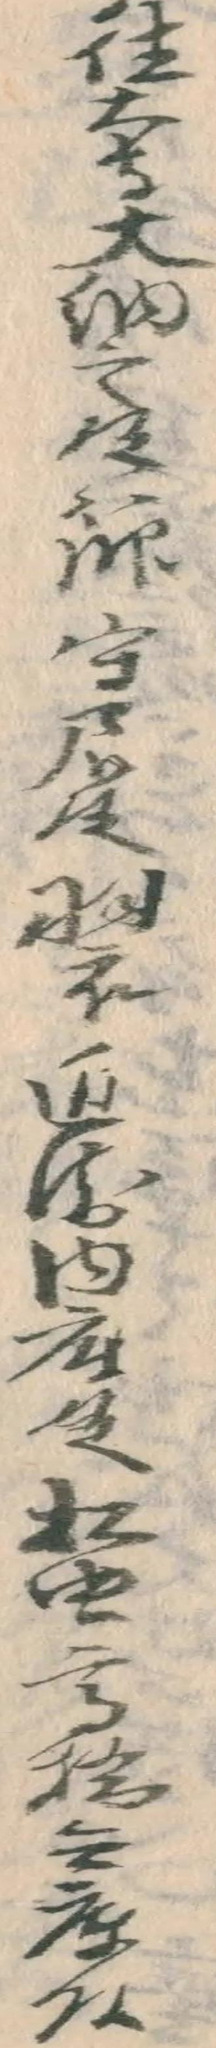徳大寺大納言殿節守君羽衣近衛内府殿松虫高橋兵庫頭
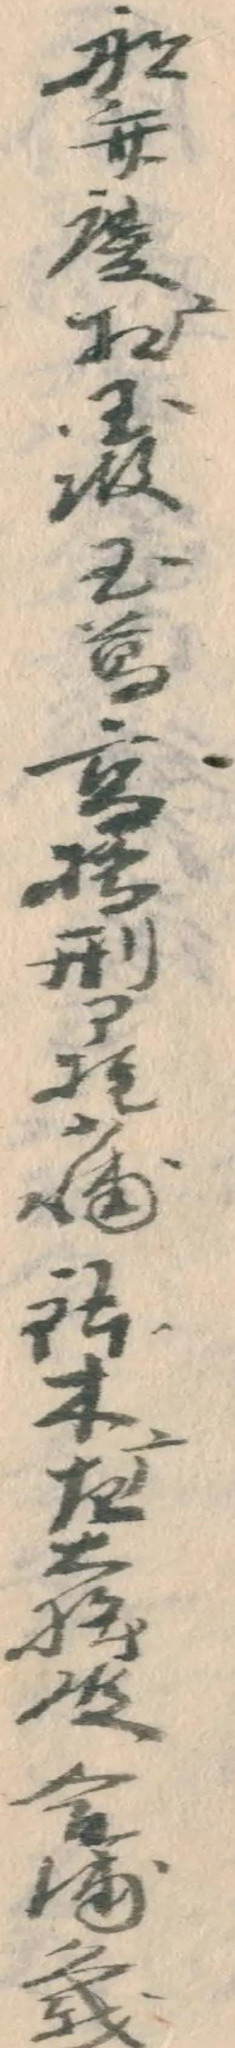舩并慶相国殿玉葛高橋刑部権少輔鉢木左大将殿金浦久我
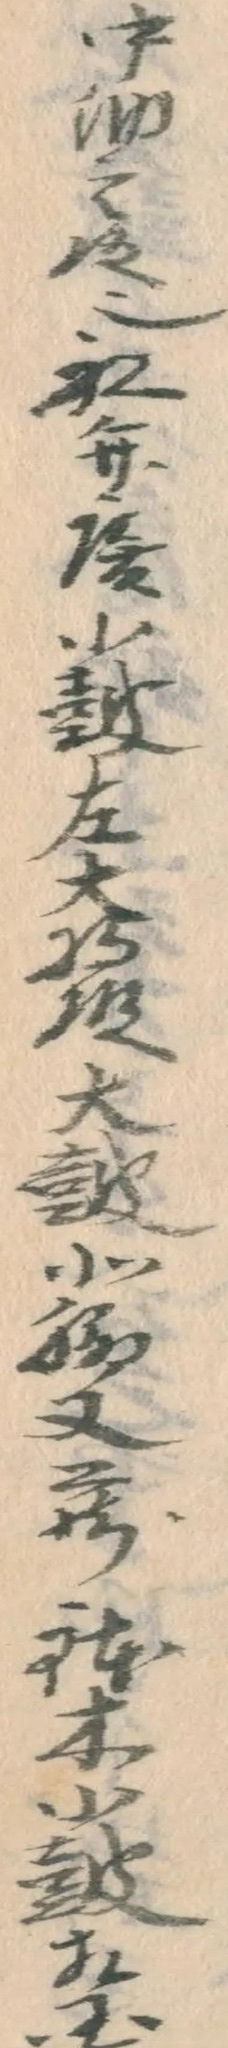中納言殿也松并慶小鼓左大将殿大皷北勝又蔵鉢木小皷相国

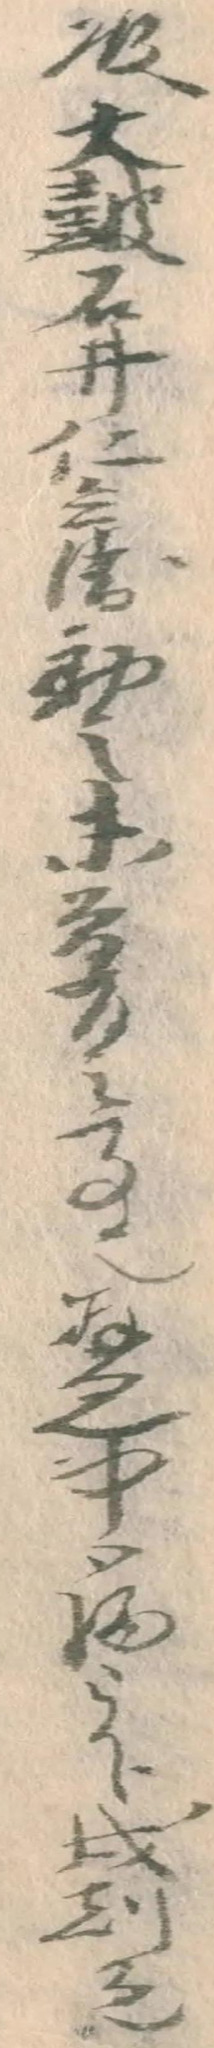殿ヘ大皷石井仁兵衛勤之末曽有之事也拝見中御酒被下戌刻過
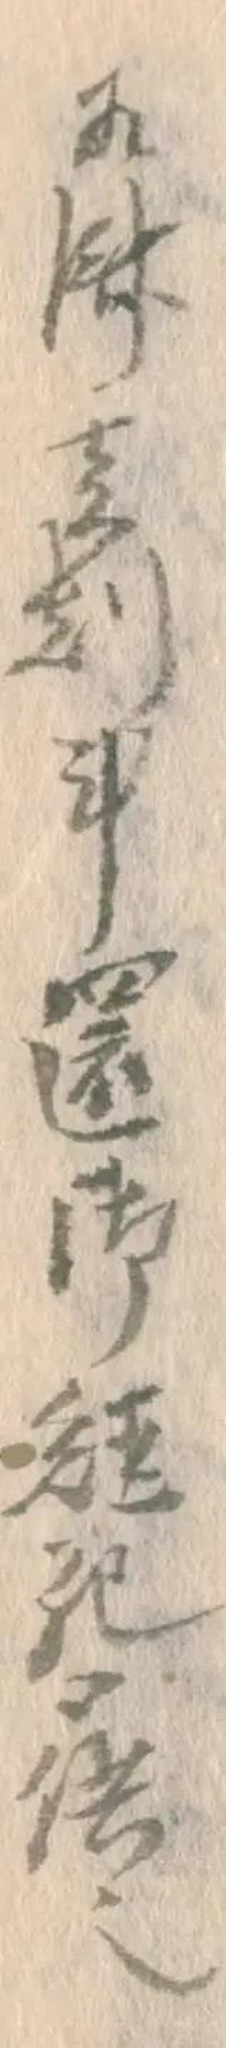相済亥刻斗還御経紀御供也
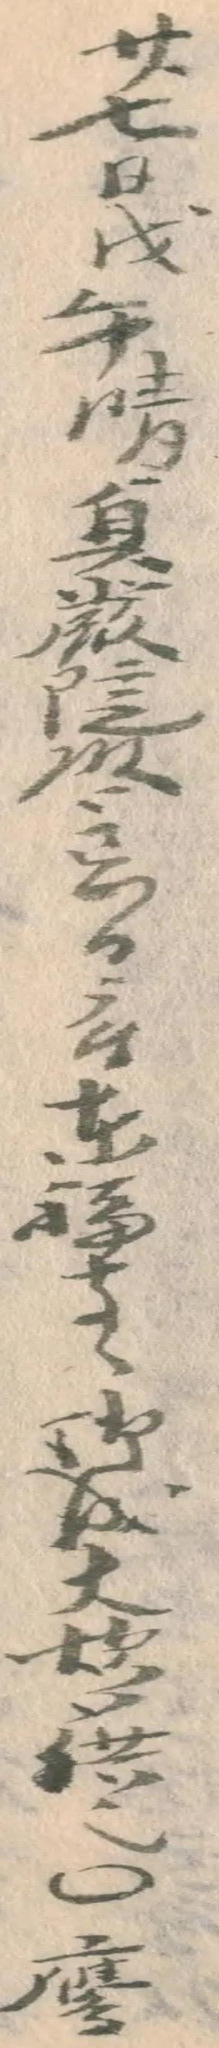廿七日戊午晴貞厳院殿御忌日ニ付東福寺へ御成大炊御供也○鷹
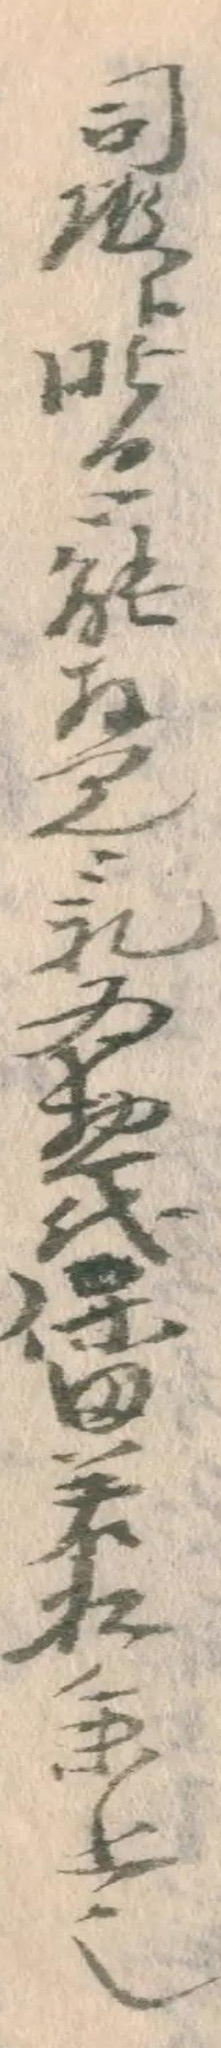司殿え昨日御能拝見御礼為惣代保田若松参上也
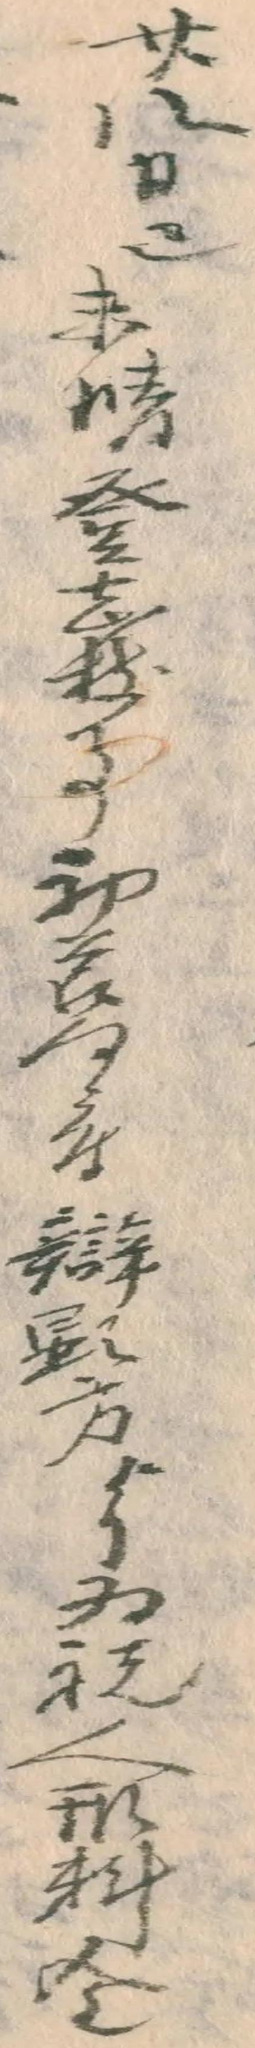廿八日己未晴登志枝事初節句ニ付辨顕方より為祝人形料金
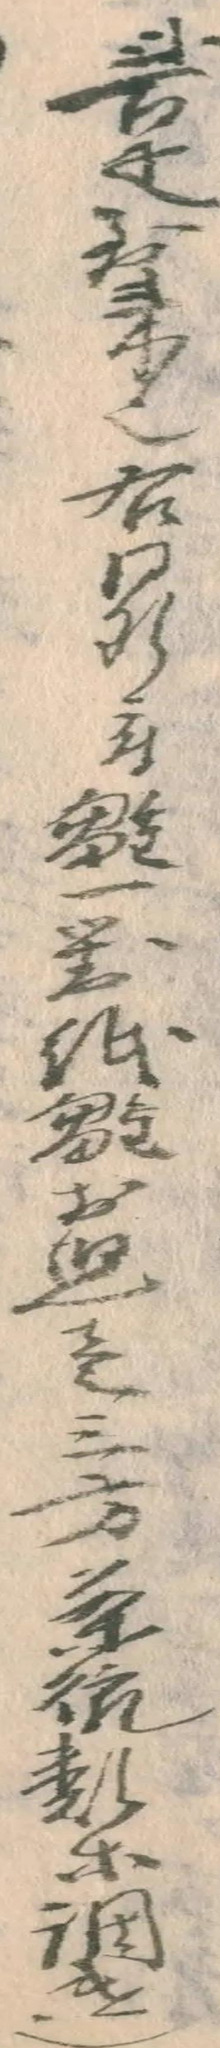弐百疋到来也右同断ニ付雛一對紙雛お児壱三方茶碗類等調遣也
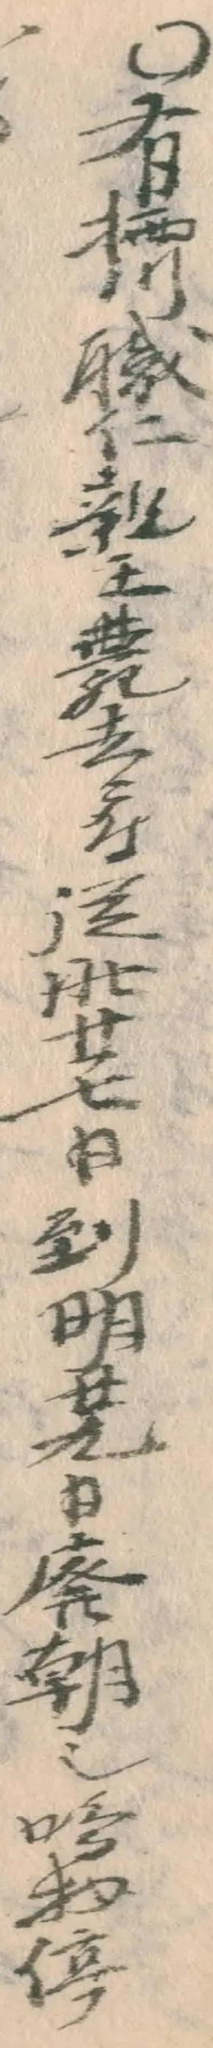○有栖川職仁親王薨去ニ付従昨廿七日到明廿九日廃朝也鳴物停
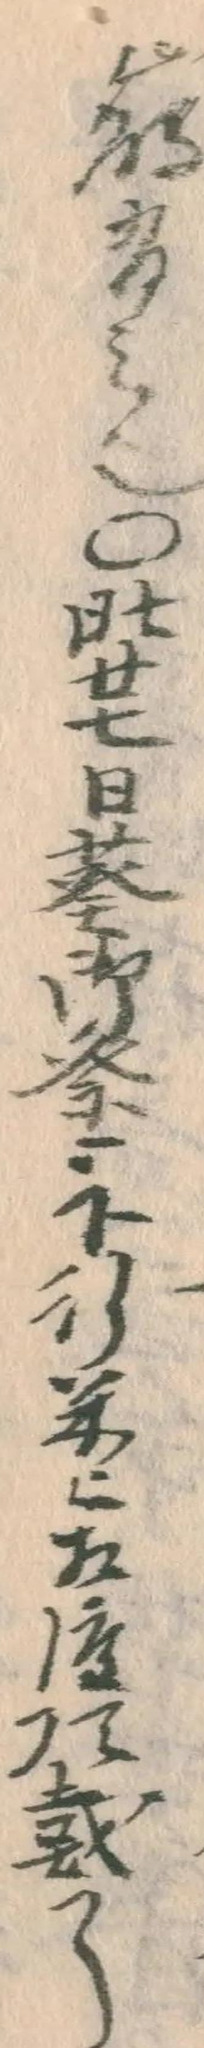止有之也○昨廿七日葵御参被下行米被相渡頂戴了
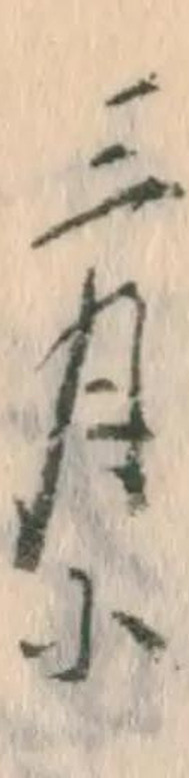三月小
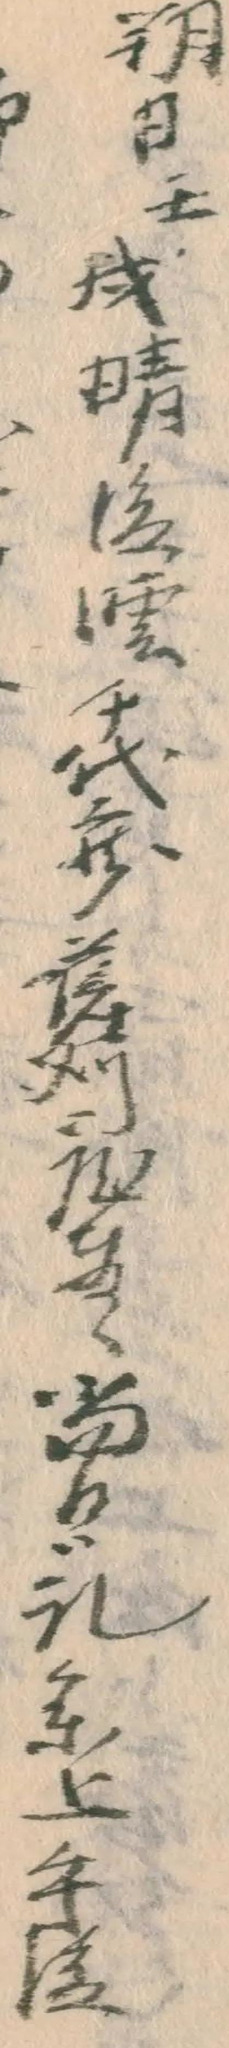朔日壬戌晴後曇千代蔵薩州御屋敷へ當日御礼参上午後
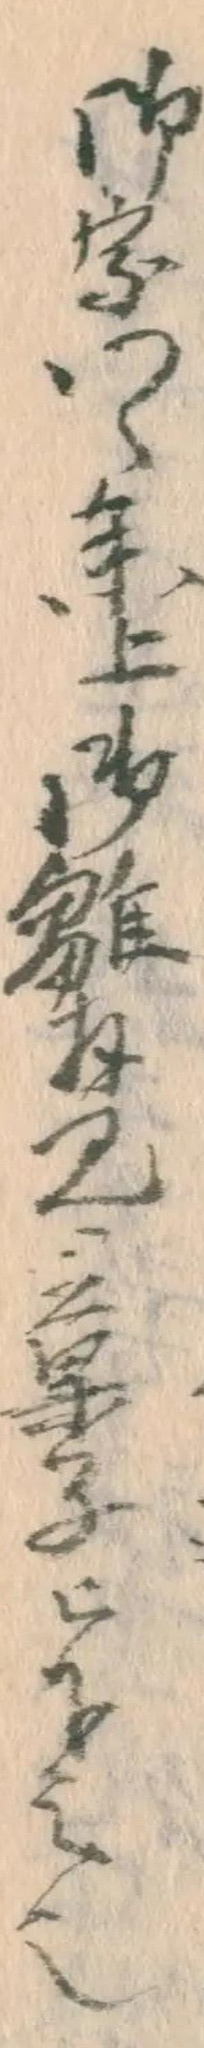御家門へ参上御雛拝見菓子被下之也
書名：賀茂社記録. 第70冊
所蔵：国立国会図書館 National Diet Library, JAPAN
